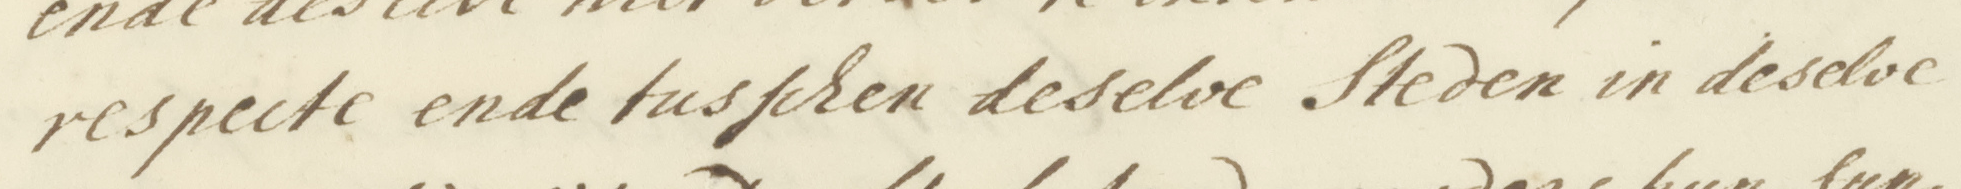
respecte ende tusschen deselve Steden in deselve
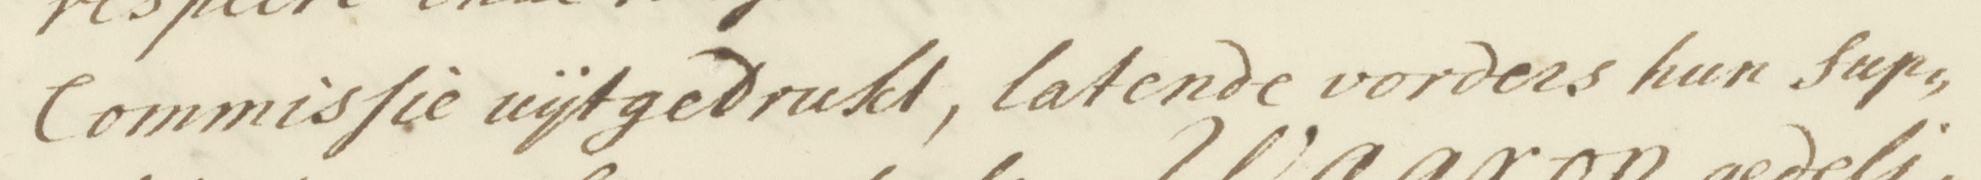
Commissie uijtgedrukt, latende vorders hun sup,,
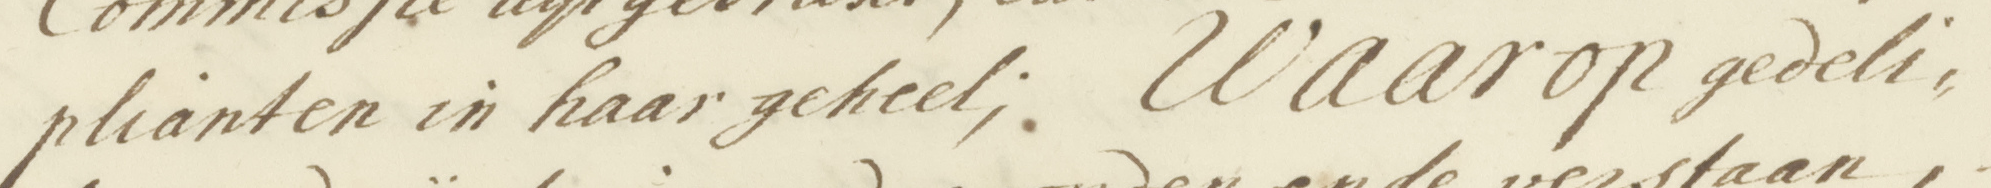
plianten in haar geheel; Waarop gedeli„
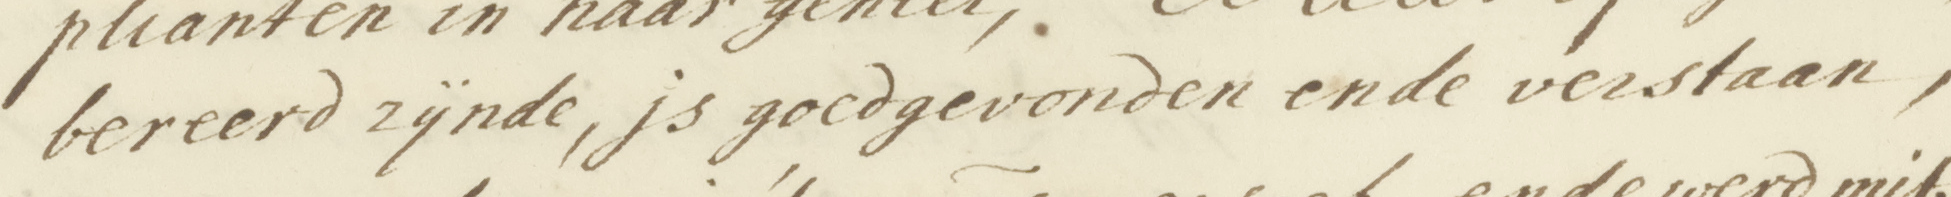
bereerd zijnde, is goedgevonden ende verstaan,
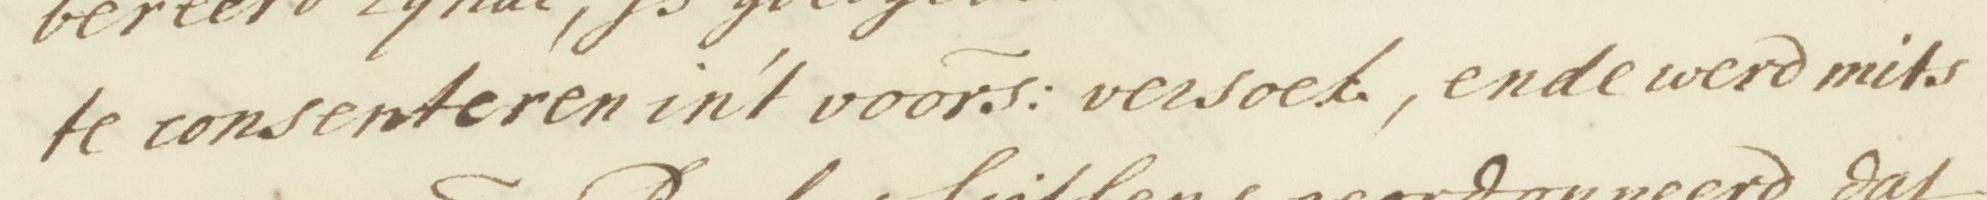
te consenteren in't voors: versoek, ende werd mits
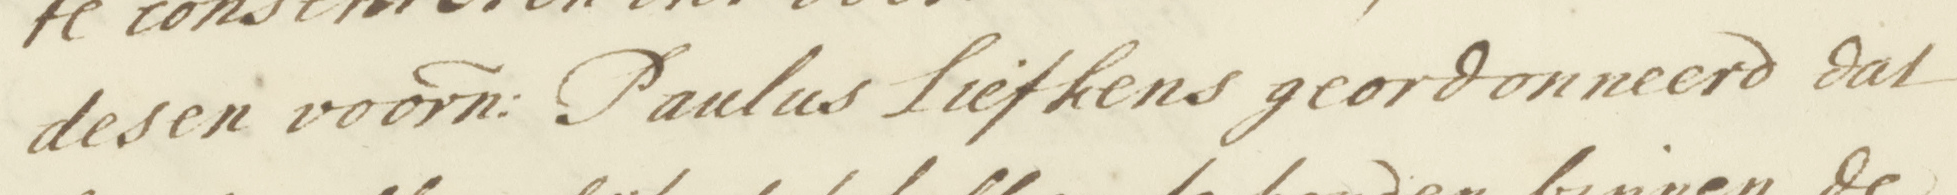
desen voorn: Paulus Liefkens geordonneerd dat
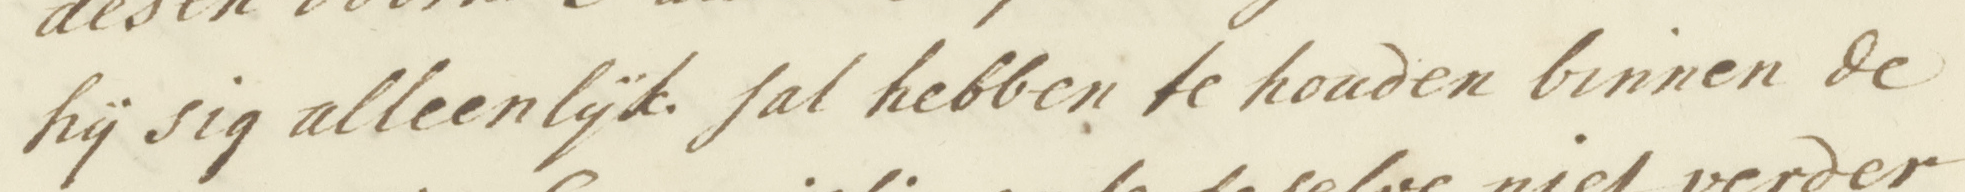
hij sig alleenlijk sal hebben te houden binnen de
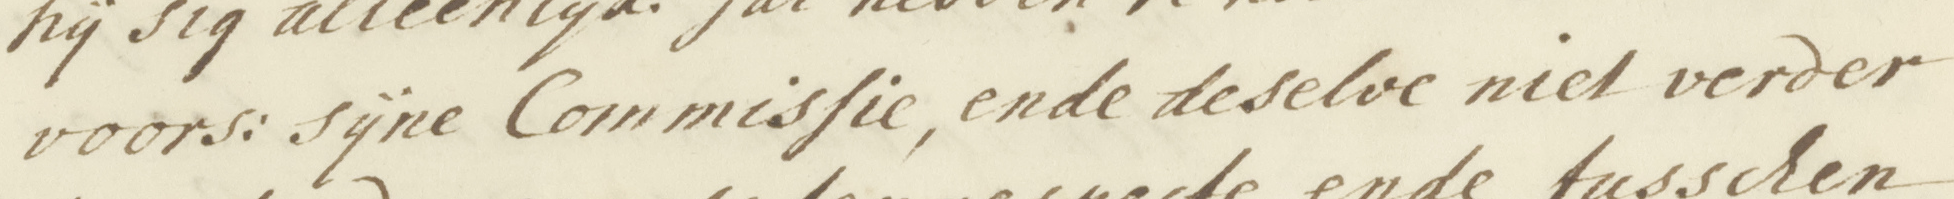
voors: sijne Commissie, ende deselve niet verder
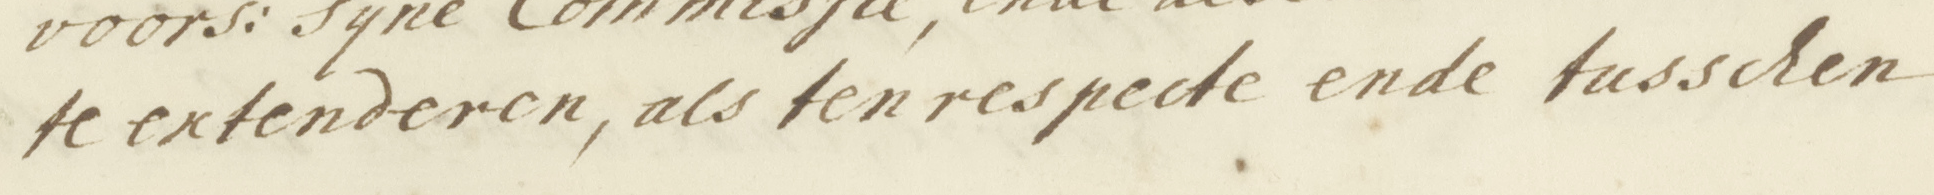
te extenderen, als ten respecte ende tusschen
